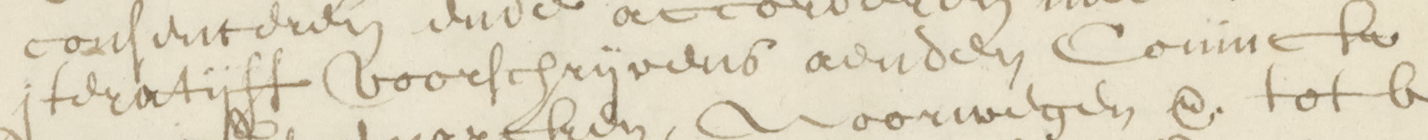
Iteratijff voorschrijvens aen den Coninck
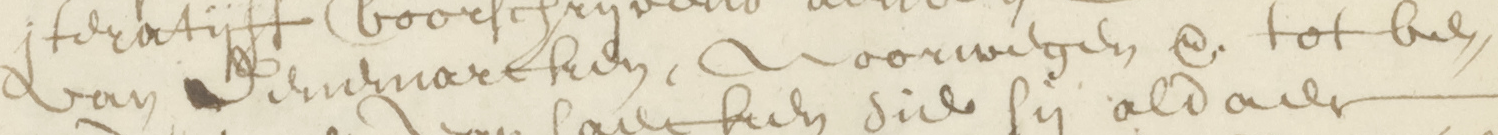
van Dennemarcken, Noorwegen & tot be,,
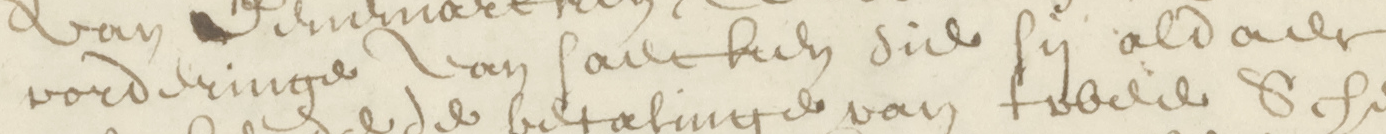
vorderinge van seacken die sij aldaer
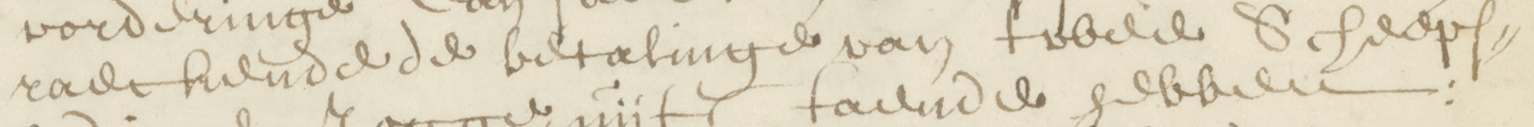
raeckende de betalinge van twee Scheeps,,
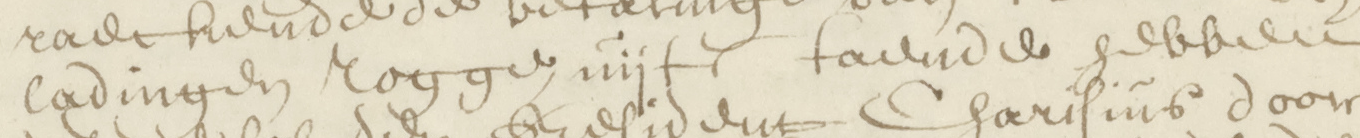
ladingen rogge, uijtstaende hebben:
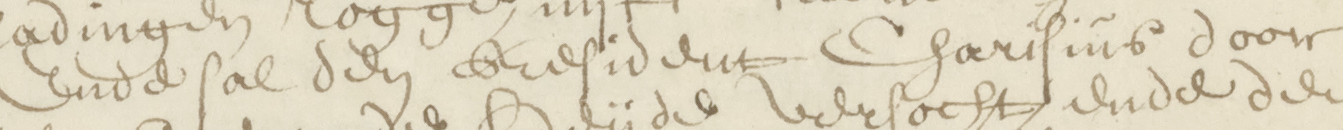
Ende sal den Resident Charisius door
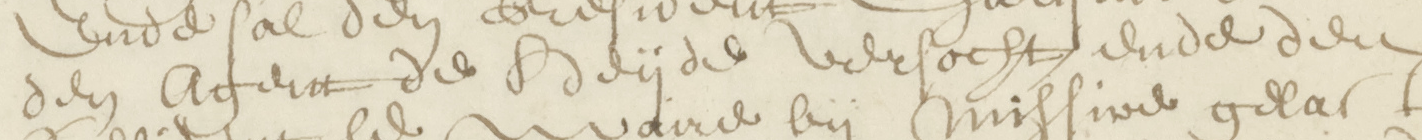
den Agent de Heijde versocht, ende den
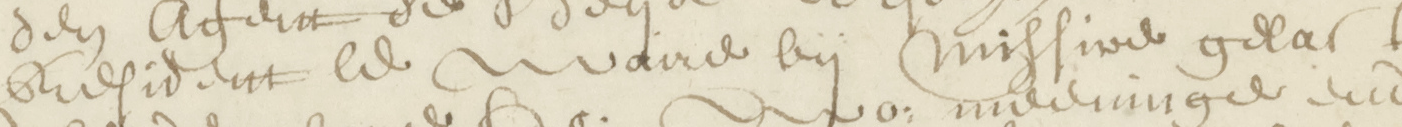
Resident le Maire bij missive gelast
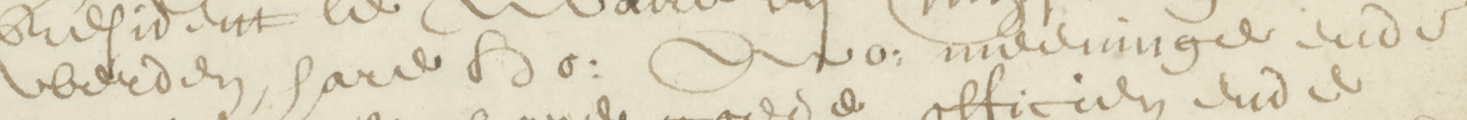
werden, hare Ho:Mo: meeninge ende
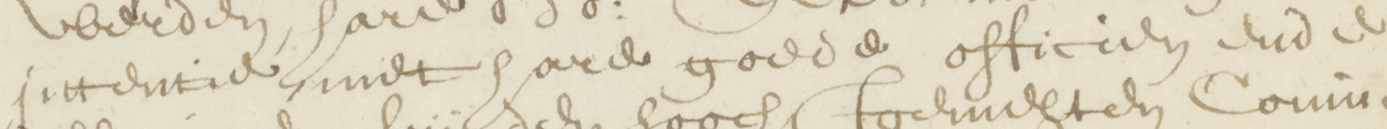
intentie, met hare goede officien ende
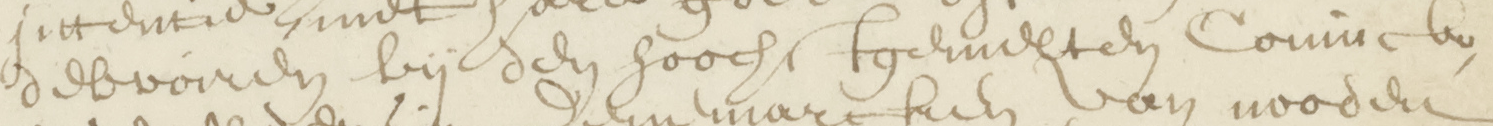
debvoiren bij den hoochsgemelten Coninck,
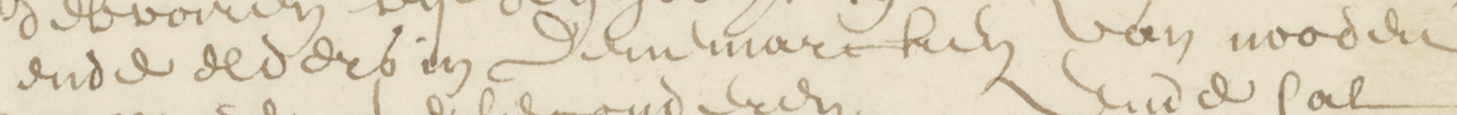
ende elders in Denemarcken van nooden
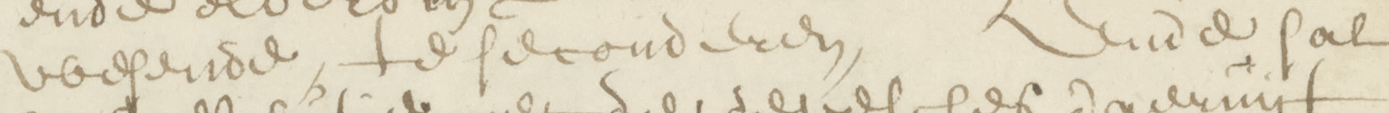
wesende, te seconderen. Ende sal
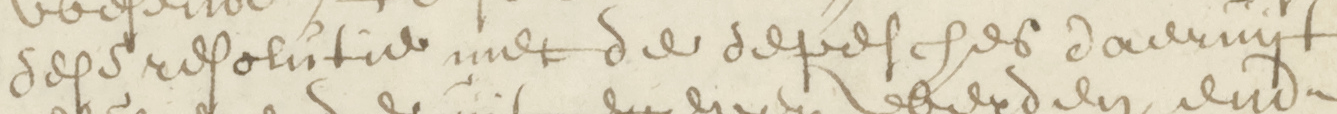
dese resolutie met de depesches daeruijt
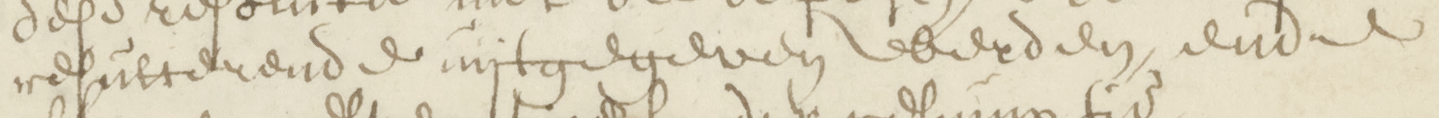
resulterende uijtgegeven werden, ende
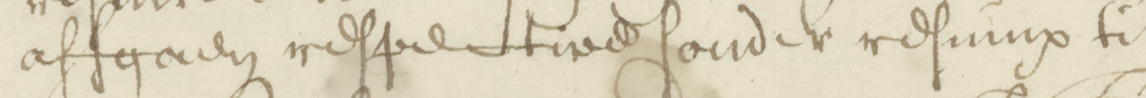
affgaen respective sonder resumptie.
